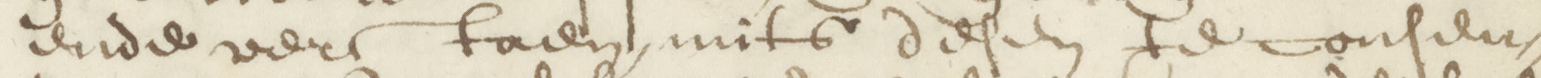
ende verstaen, mits desen te consen„
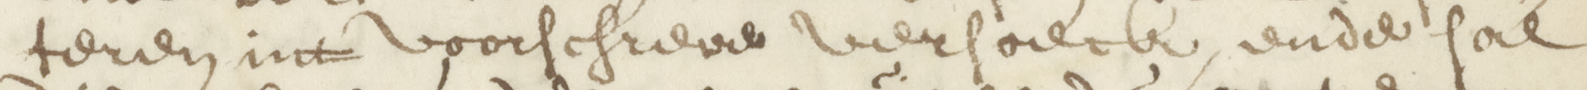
teren int voorschreve versoeck, ende sal
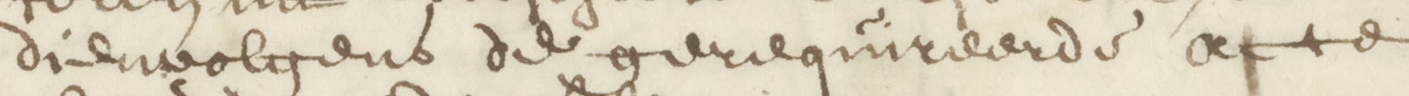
dienvolgens de gerequireerde Acte
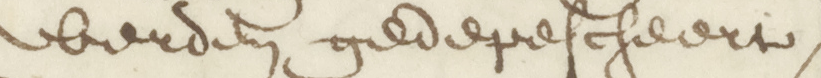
werden gedepescheert.
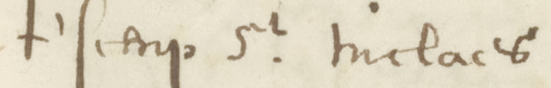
t' schip St. Niclaes
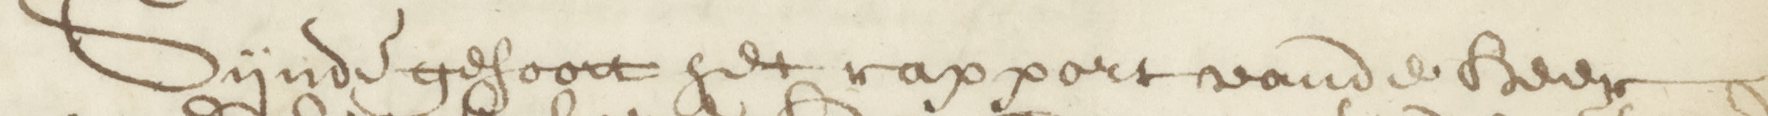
Sijnde gehoort het rapport vande Heer
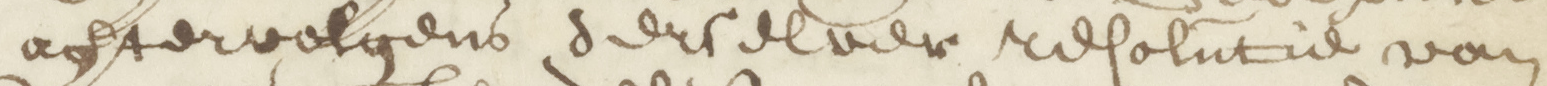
achtervolgens derselver resolutie van
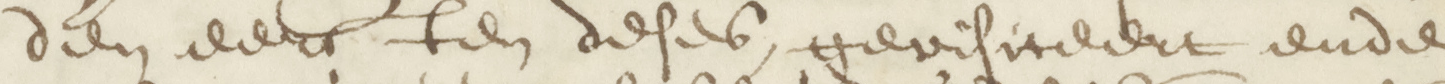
den eersten deses, gevisiteert ende
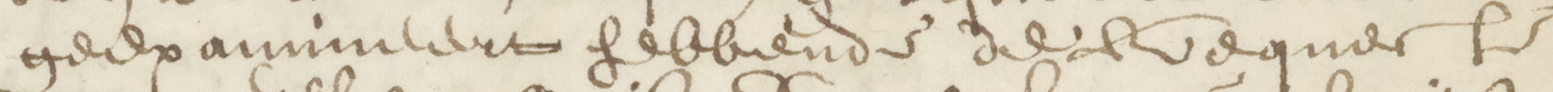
geexamineert hebbende de Requeste
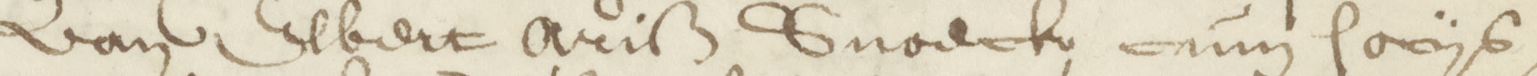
van Elbert Aris Snoeck cum socijs,
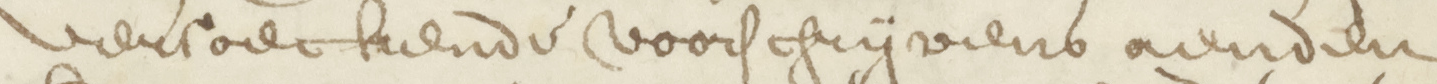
versoeckende voorschijvens aenden
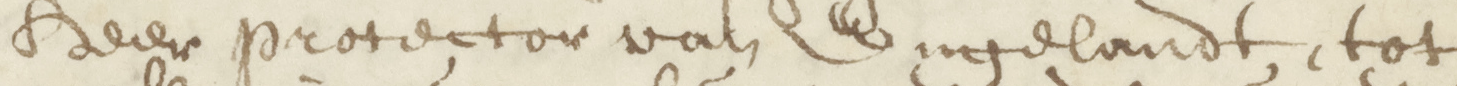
Heer protector van Engelandt, tot
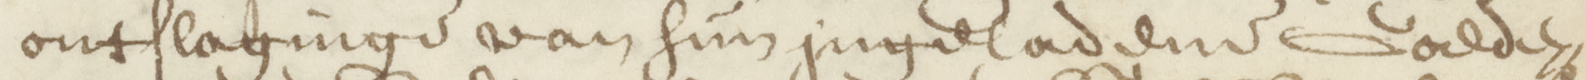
ontslaginge van hun ingeladene Goede„
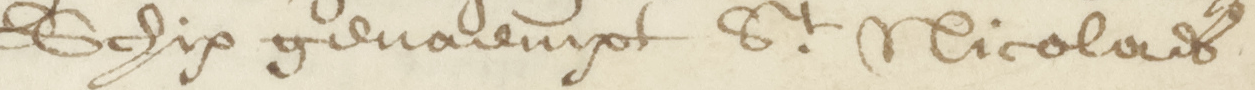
ren int Schip genaempt St. Nicolaes
